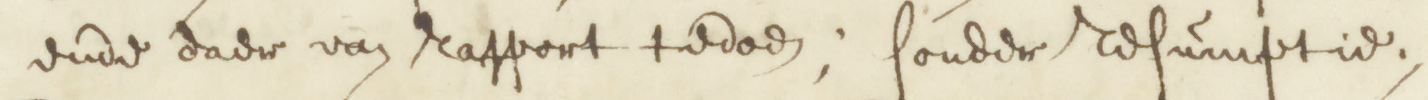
ende daer van rapport te doen; sonder resumptie.
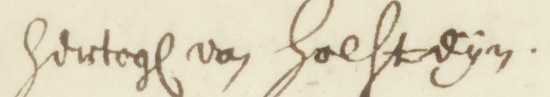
hertogh van Holsteijn.
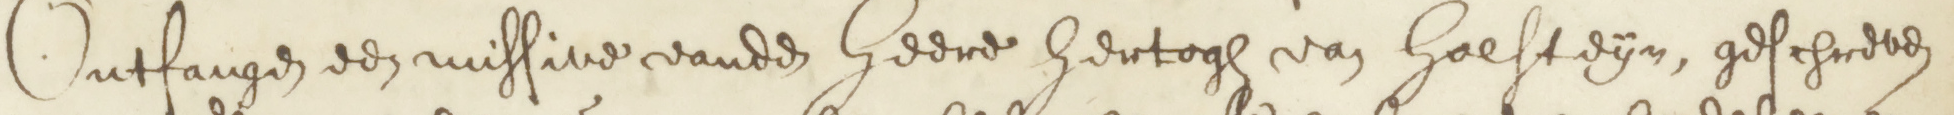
Ontfangen een missive vanden Heere hertogh van Holsteijn, geschreven
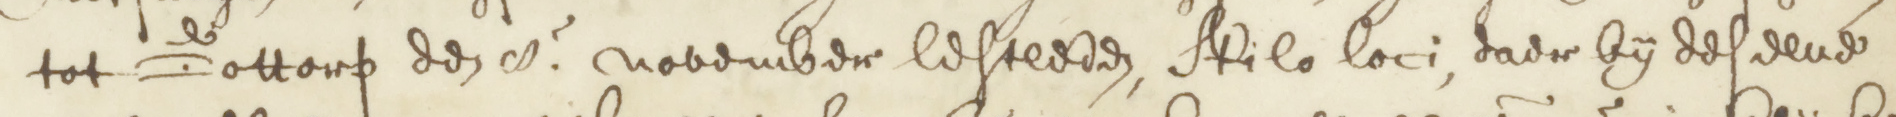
tot Gottorp den 8e. november lestleden, stilo loci, daer bij deselve
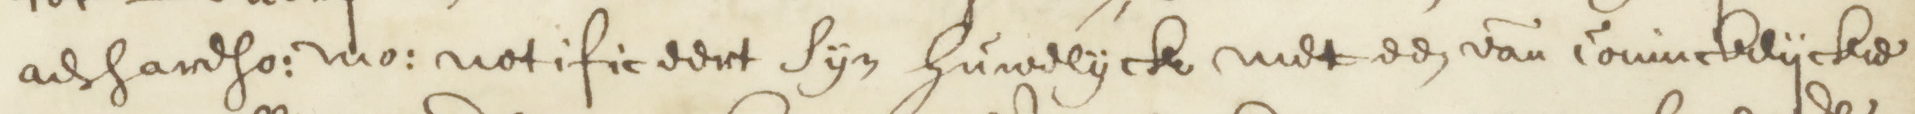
aen hare ho:mo: notificeert sijn huwelijck met een van Conincklijcke
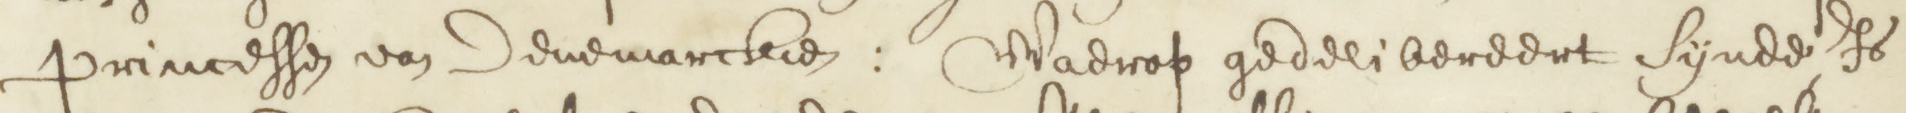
Princessen van Denemarcken: Waerop gedelibereert sijnde, Is
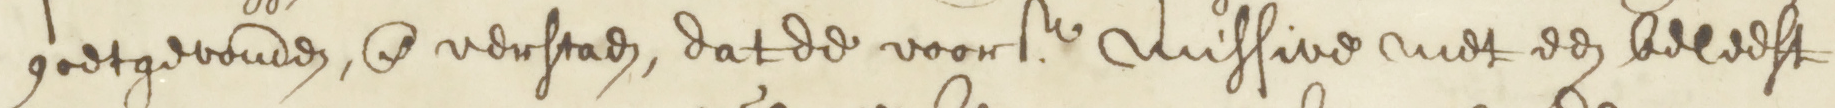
goetgevonden, & verstaen, dat de voors. missive met een beleeft
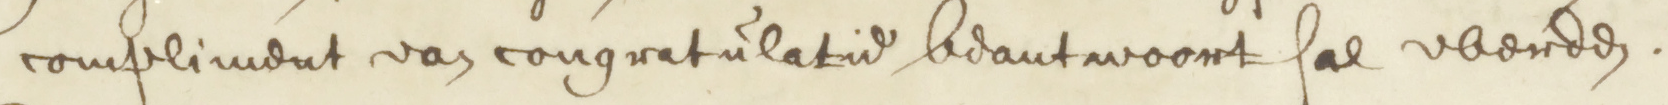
compliment van congratulatie beantwoort sal werden.
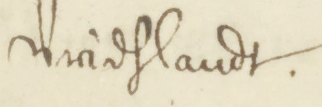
Vrieslandt.
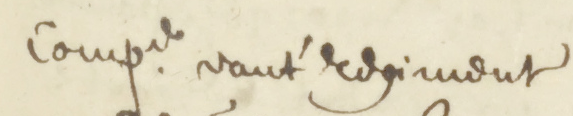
Compe. vant‛ regiment
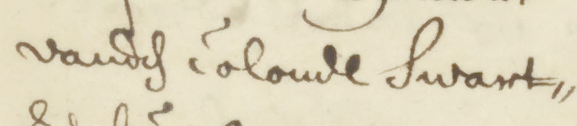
vanden Colonel Swart„
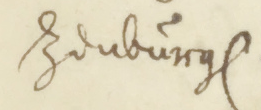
zenburgh.
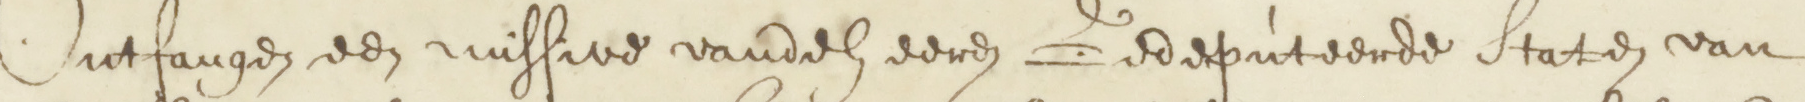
Ontfangen een missive vande heeren Gedeputeerde Staten van
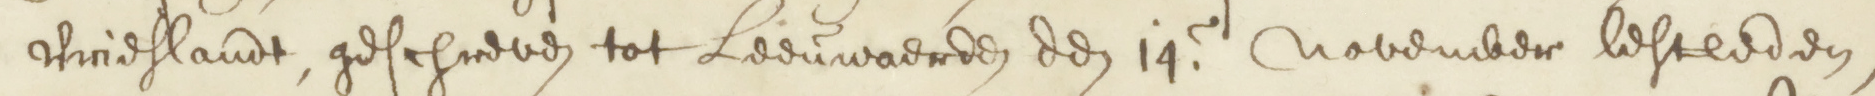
Vrieslandt, geschreven tot Leeuwaerden den 14e november lestleden,
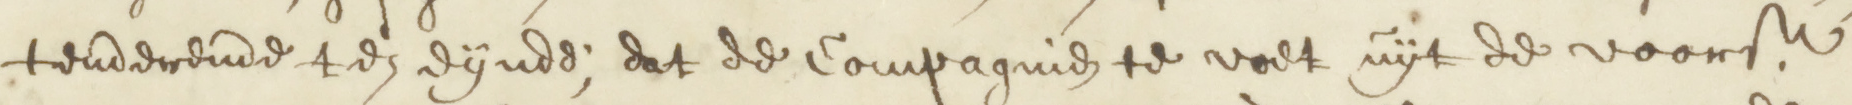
tenderende ten eijnde; dat de Compagnien te voet uijt de voors.
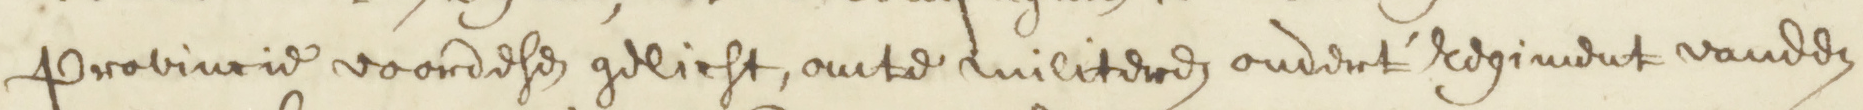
Provincie voor desen gelicht, om te militeren ondert' regiment vanden
